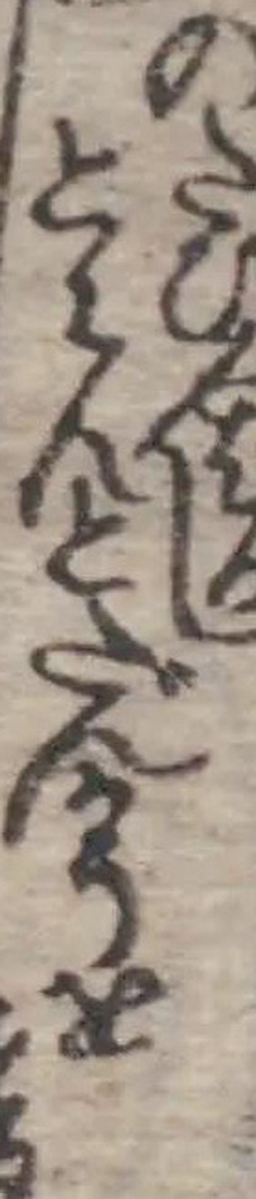とらんとだんかうをする
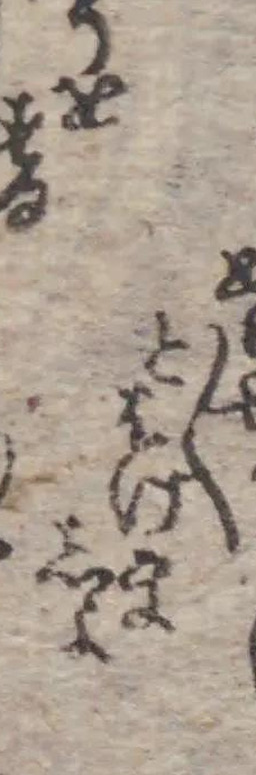とはけま
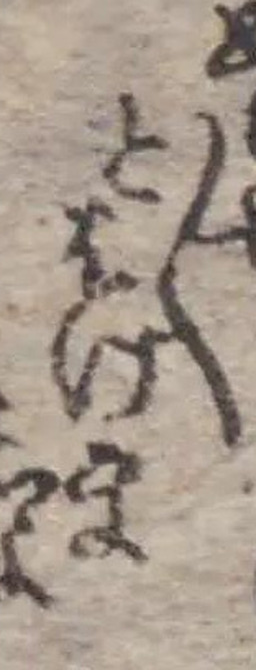とはけま
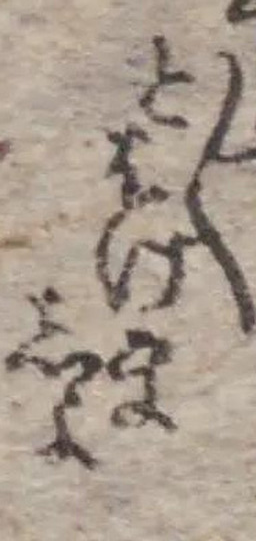とはけま
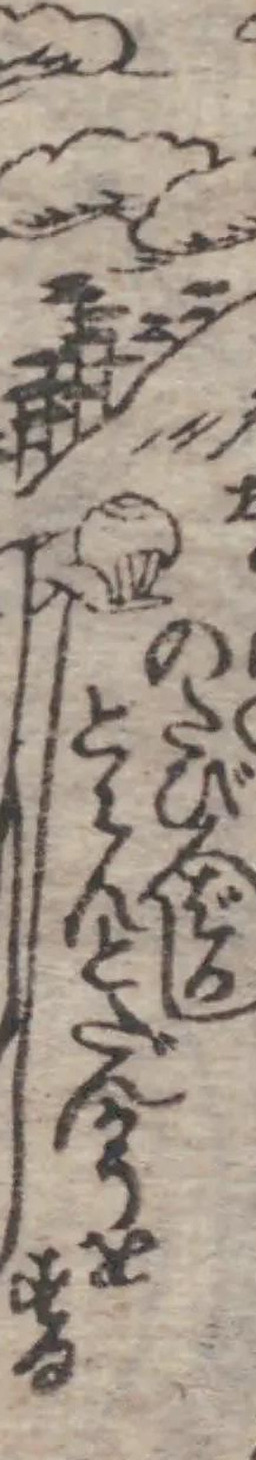とらんとだんかうをする
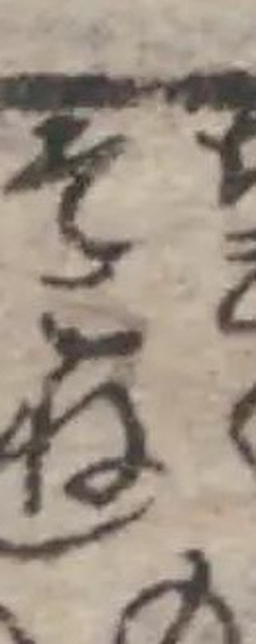そこねし
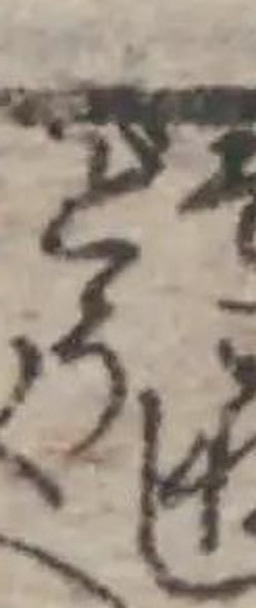どうく
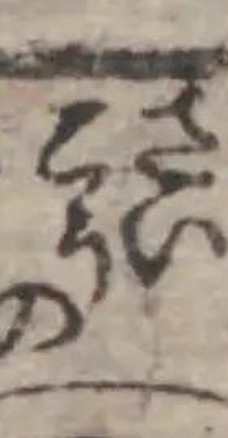こうの
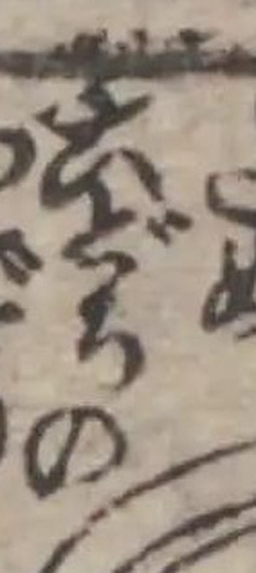六どうの
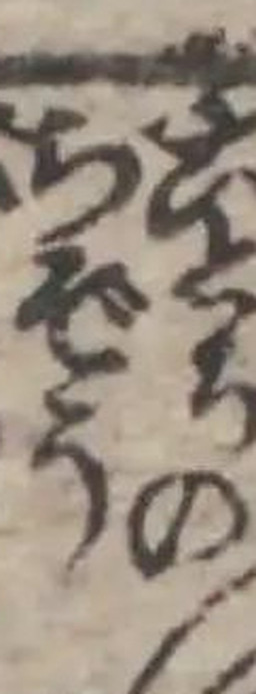ちぞう
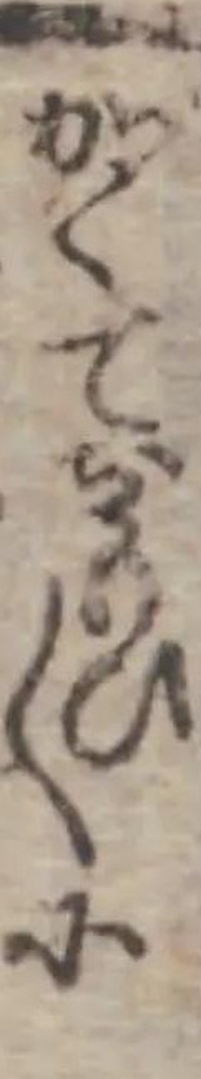かくておもひ
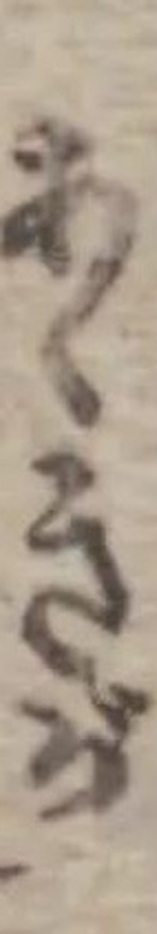あゝきが
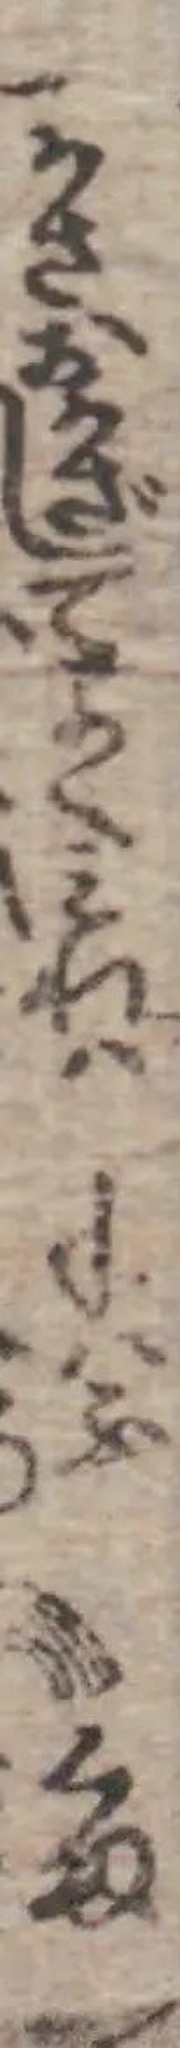かさおかざしてよくみれは
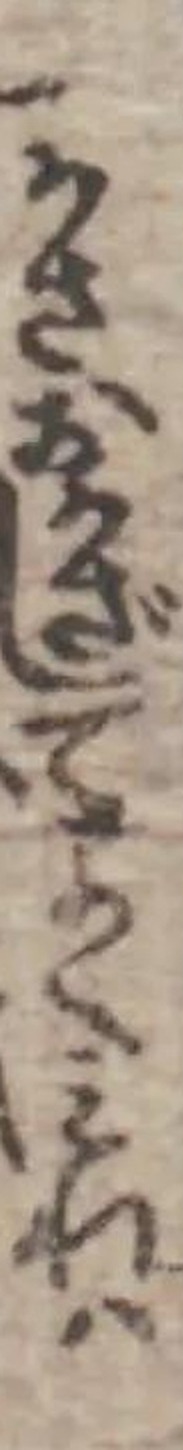かさおかざしてよくみれは
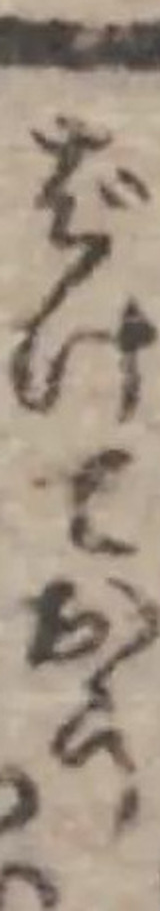ばけておう
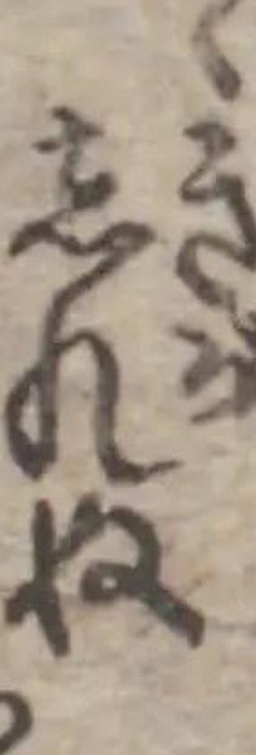しれぬ
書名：大磯地蔵咄 2巻
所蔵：国立国会図書館 National Diet Library, JAPAN
